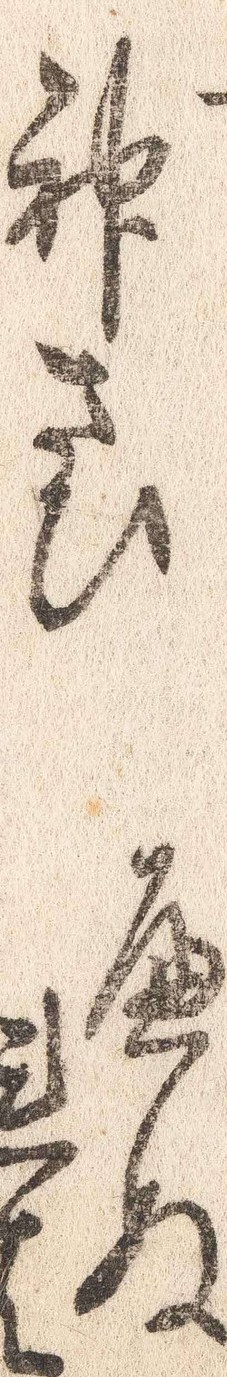神さひへぬ
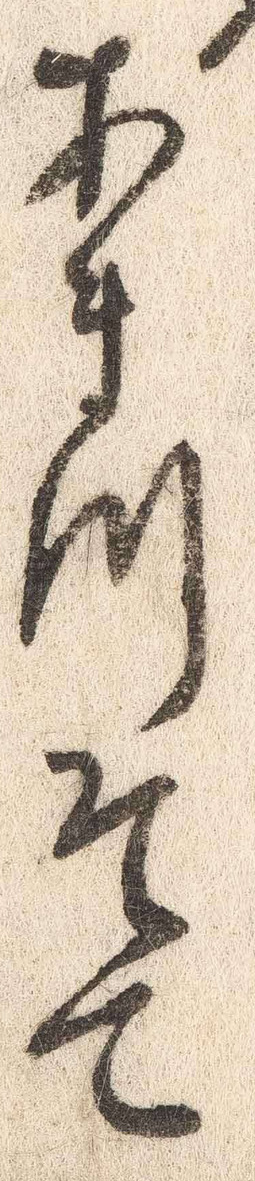あまつそて

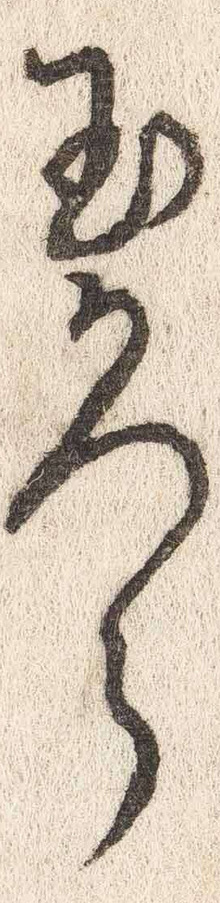玉かつら
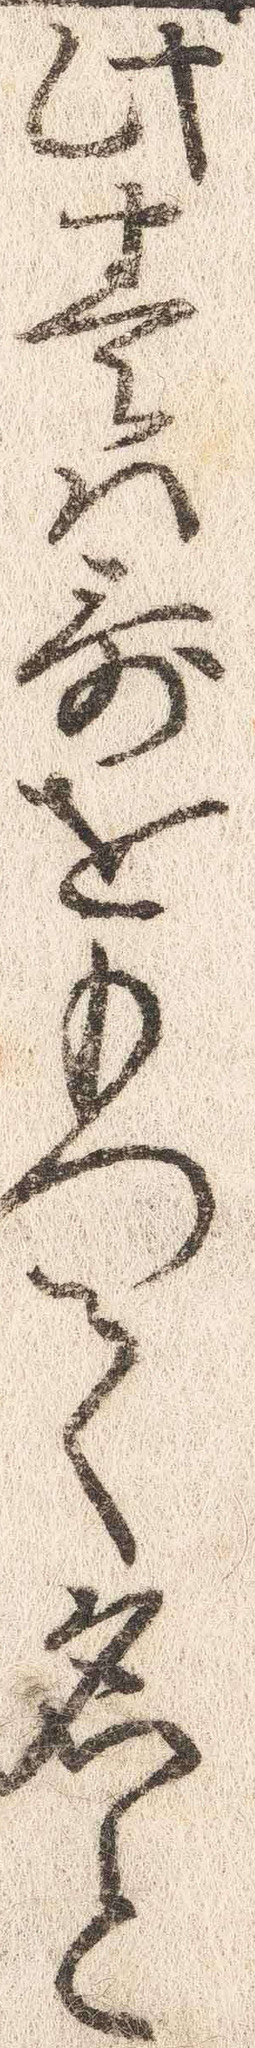此巻は歌をもつて名と
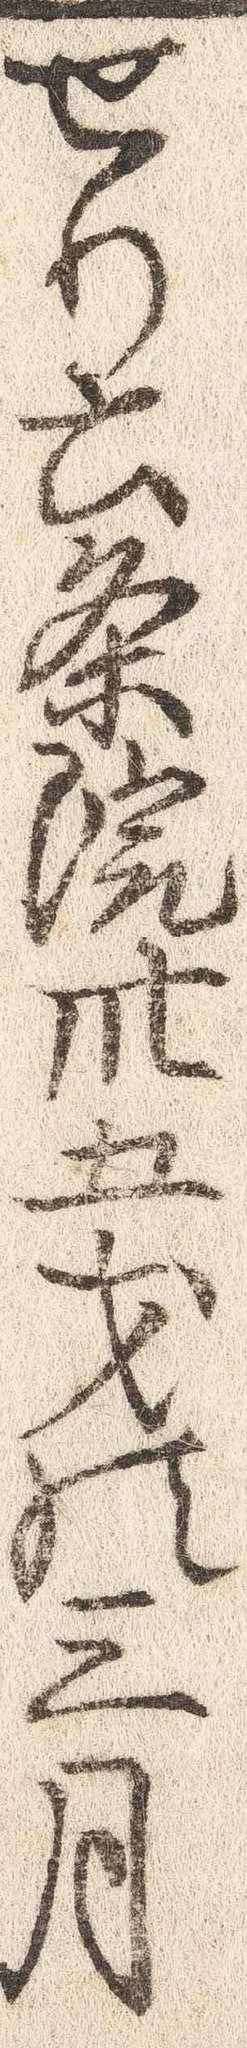せり六条院卅五才の三月
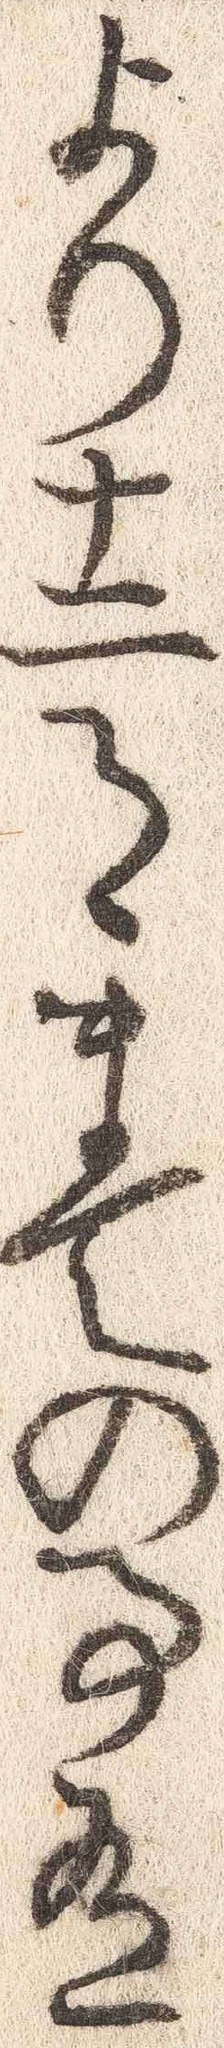より十二月まての事有
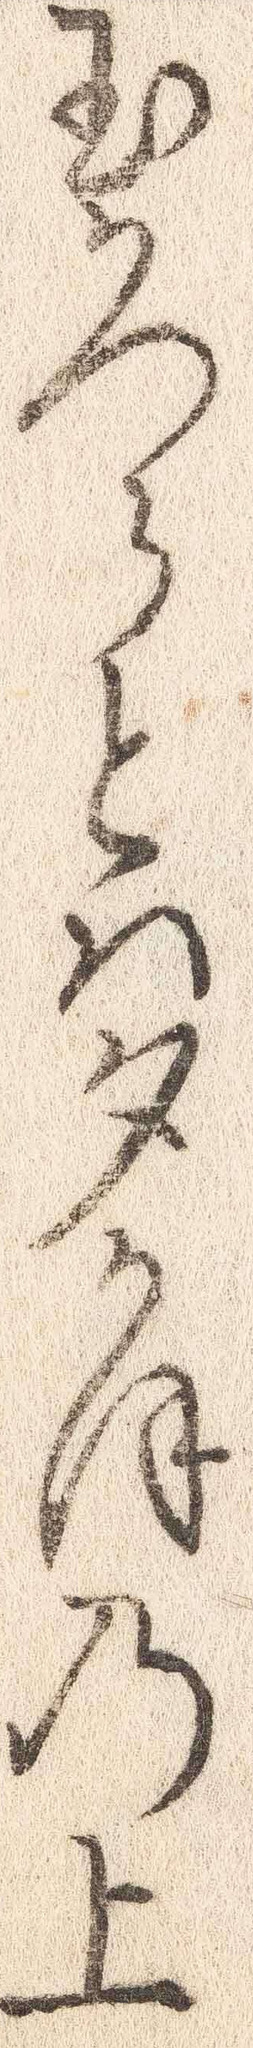玉かつらとは夕かほの上
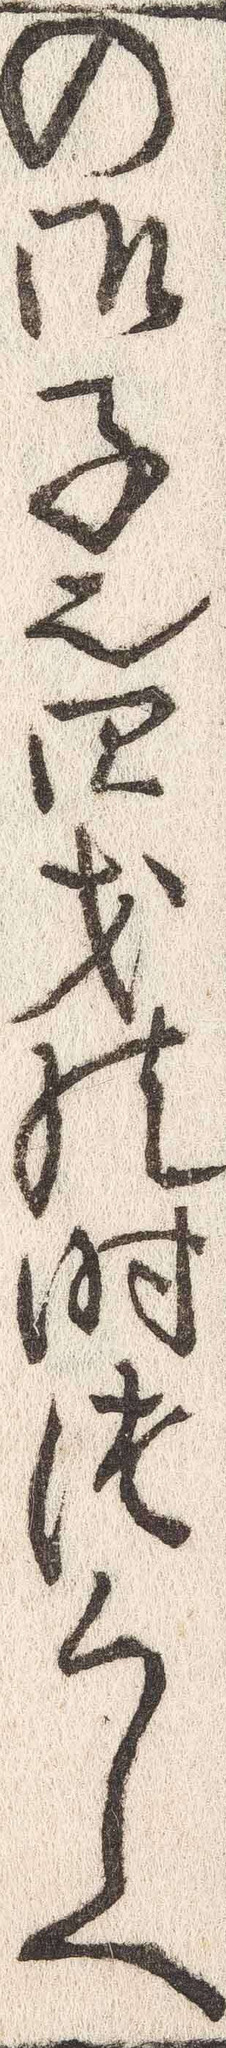の御子也四才の時つくしへ
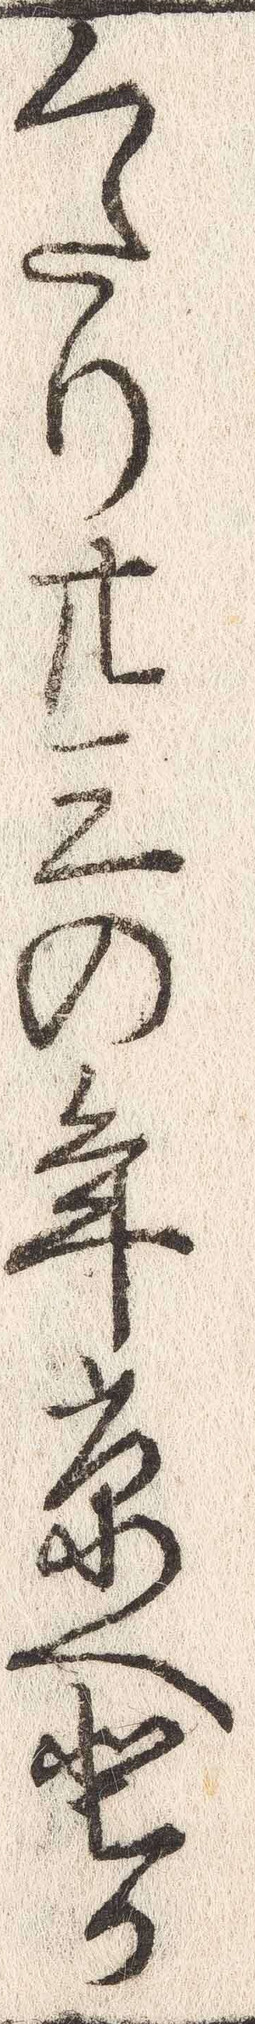くたり廿三の年京へ登り
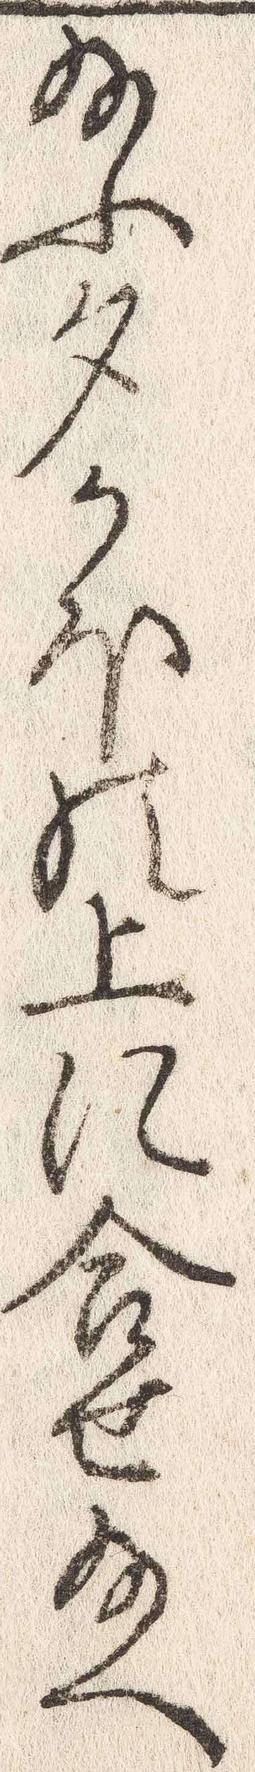給ふ夕かほの上に合せ給へ
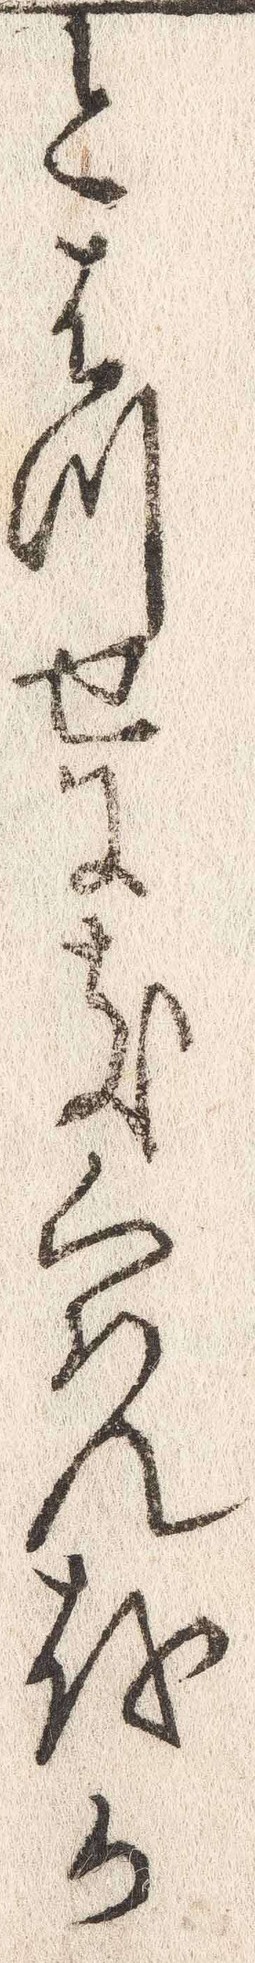とはつせにきくはんをか
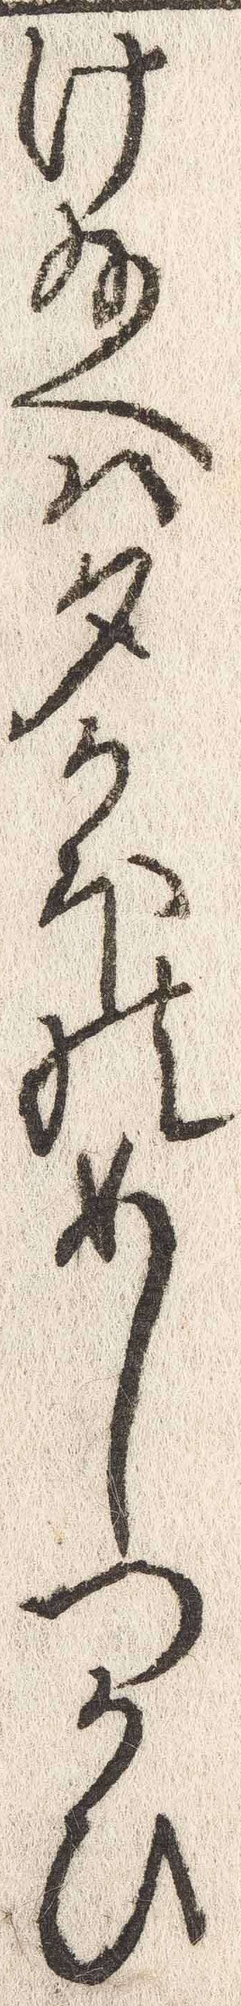け給へは夕かほのめしつかひ

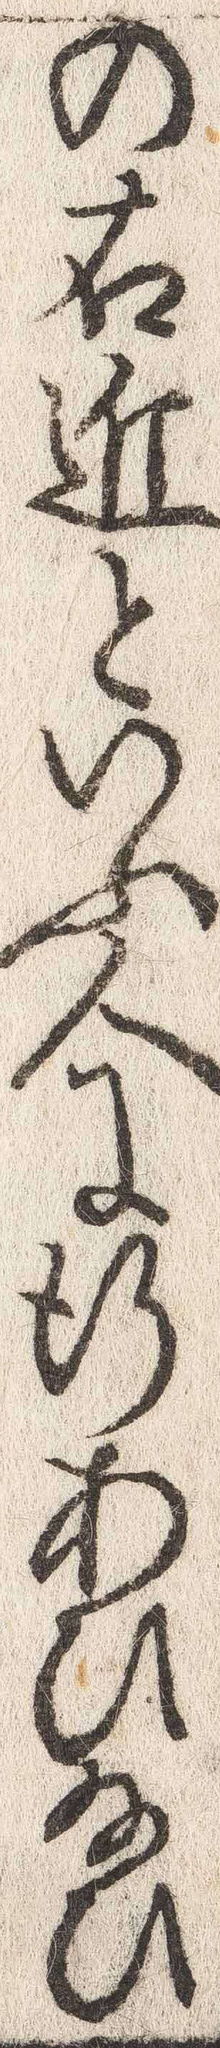の右近といふ人に行あひ給ひ
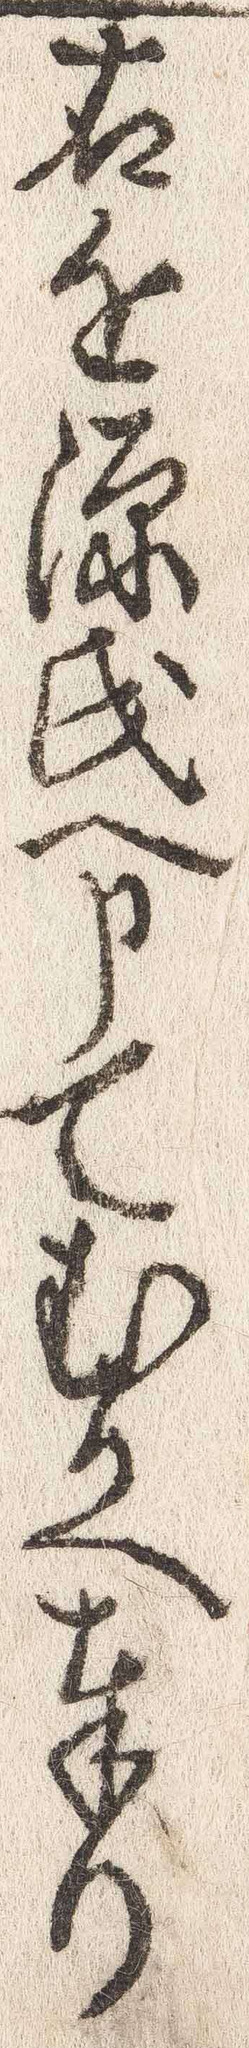右近源氏へ申てむかへ奉り
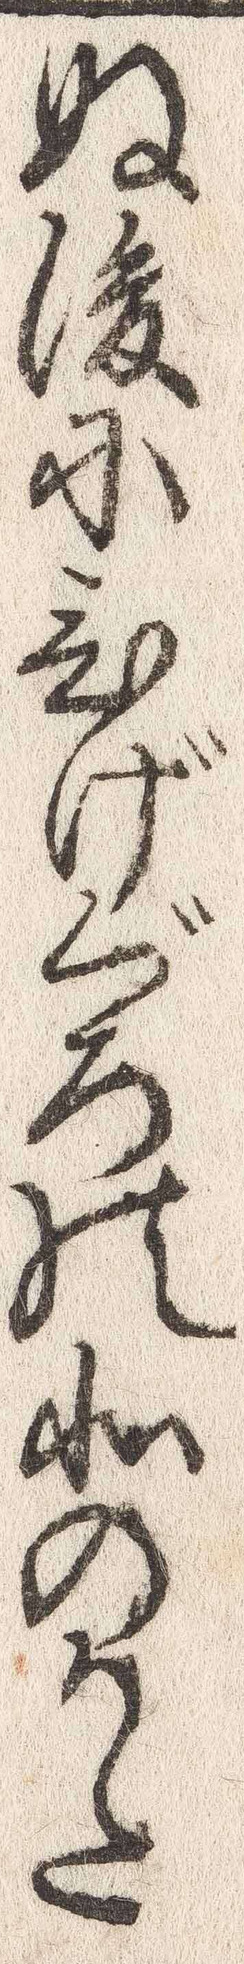ぬ後にひげぐろの北のかた
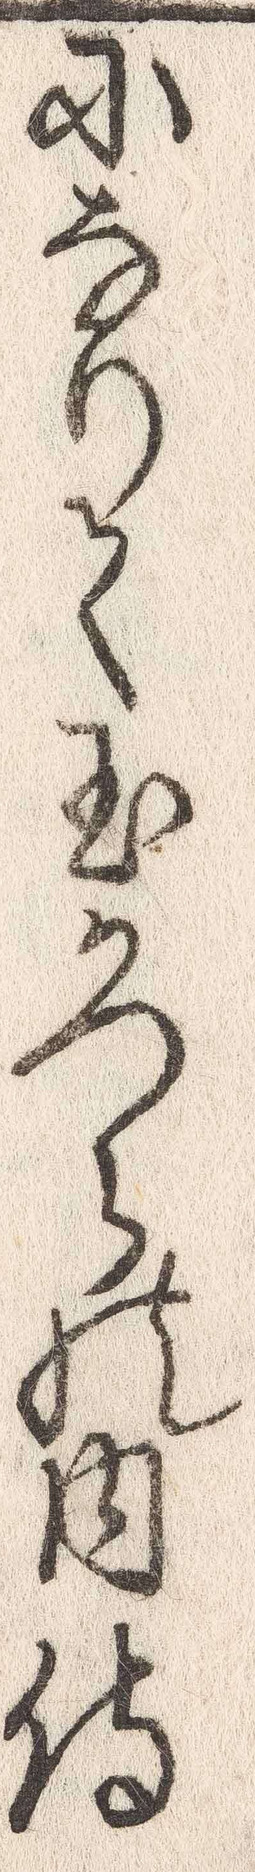になりて玉かつらの内侍
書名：源氏物語
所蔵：東京学芸大学附属図書館 国文学研究資料館
